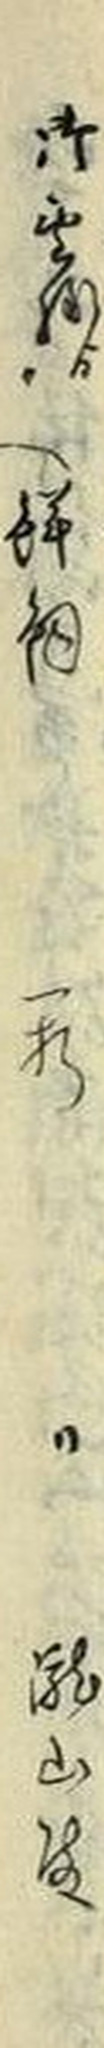御台様ゟ鮮鯛一折同瀧山殿
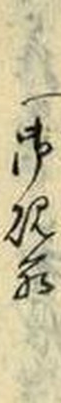御硯箱一
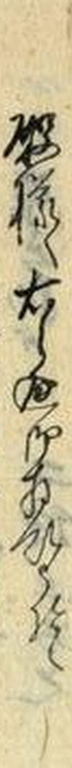殿様へ右之通御拝領被遊候
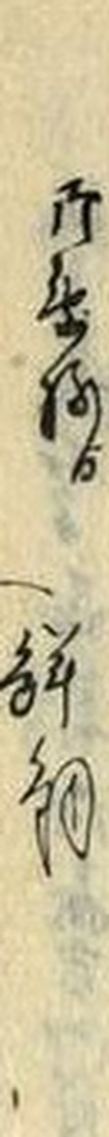御台様ゟ鮮鯛一折
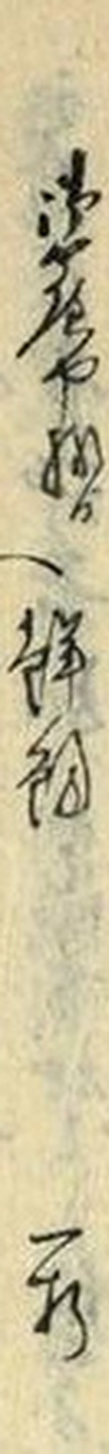御簾中様ゟ鮮鯛一折
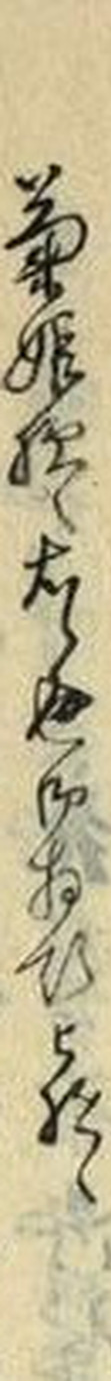菊姫様へ右之通御拝領被遊候
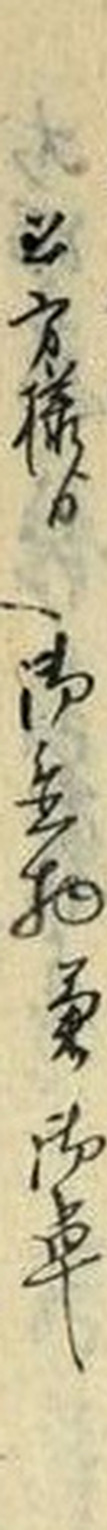公方様ゟ御置物兼御卓
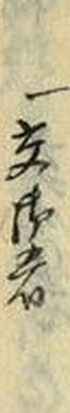交御肴一台
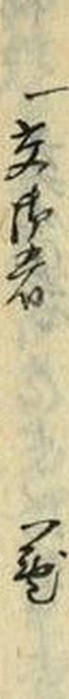交御肴一台
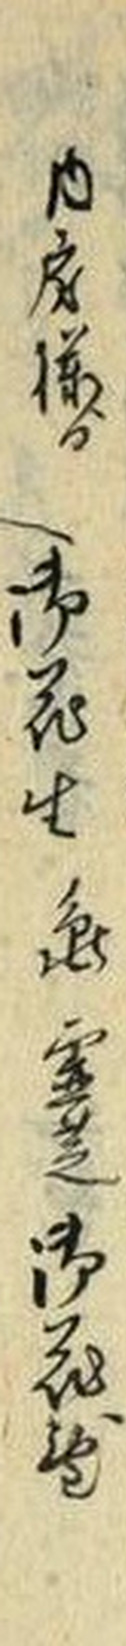内府様ゟ御花生亀霊芝御花台

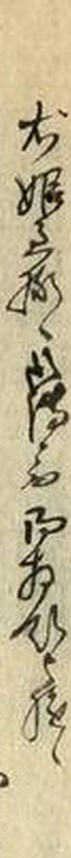右姫君様へ御伝ニ而御拝領被遊候
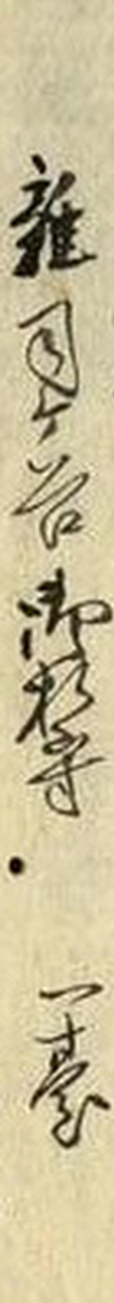雑司ヶ谷御札守一台
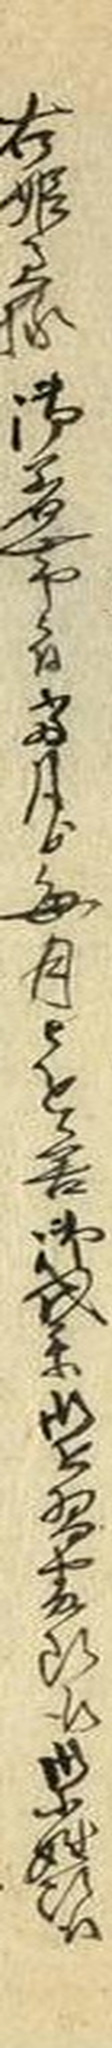右姫君様御着帯ニ付当月ゟ毎月被進候筈御代参御近習番頭取御小姓番頭取
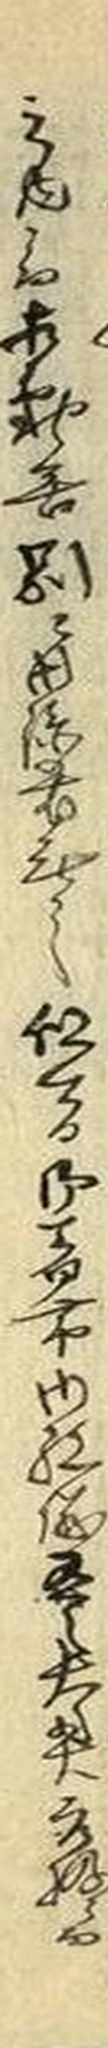之内ニ而相勤候筈別ニ御添肴無之但今日御着帯御祝儀有之大奥取扱ニ而
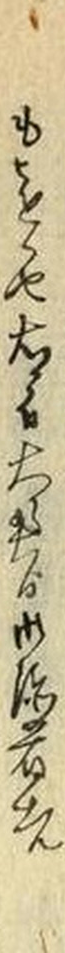も被進候由右ニ付大奥ゟ御添肴出ㇽ
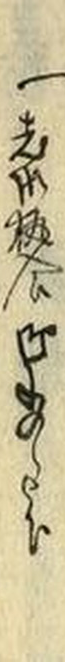老御執合御手のし被下
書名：少傅日録抄（斉承付側向頭取日記、在府）
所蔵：福井県文書館 Fukui Prefectural Archives
